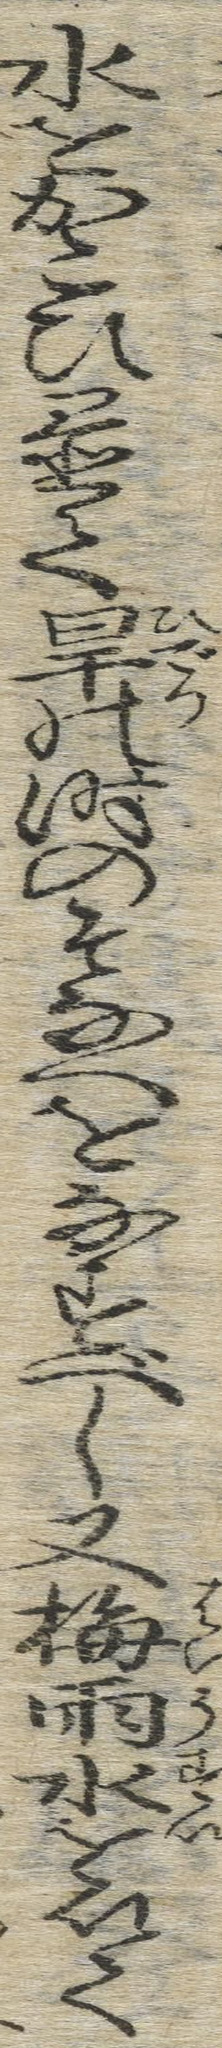水をかこひ普く旱の時のそなへをなすべし又梅雨水を以て
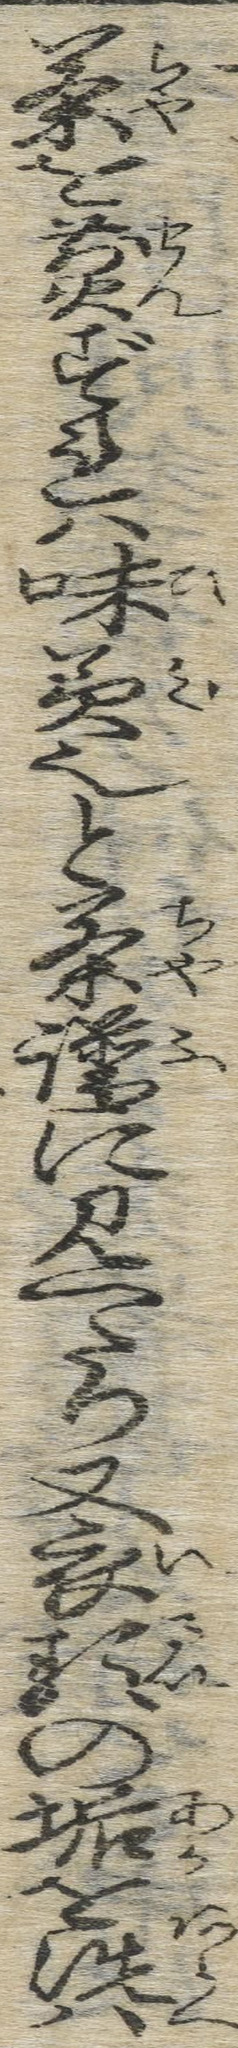茶を煎ずれは味曽也と茶譜に見へたり又衣類の垢を洗は
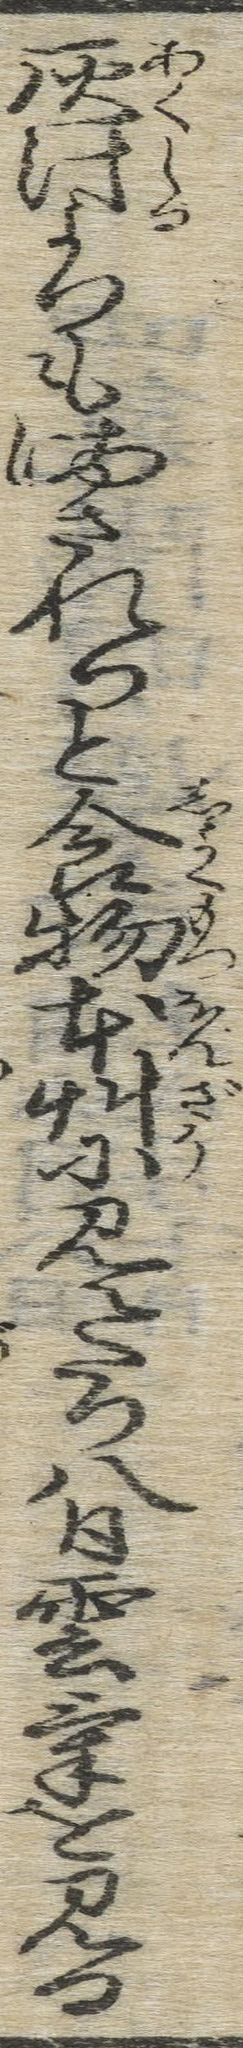灰汁よりもまされりと食物本艸に見えたり八日雲気を見る
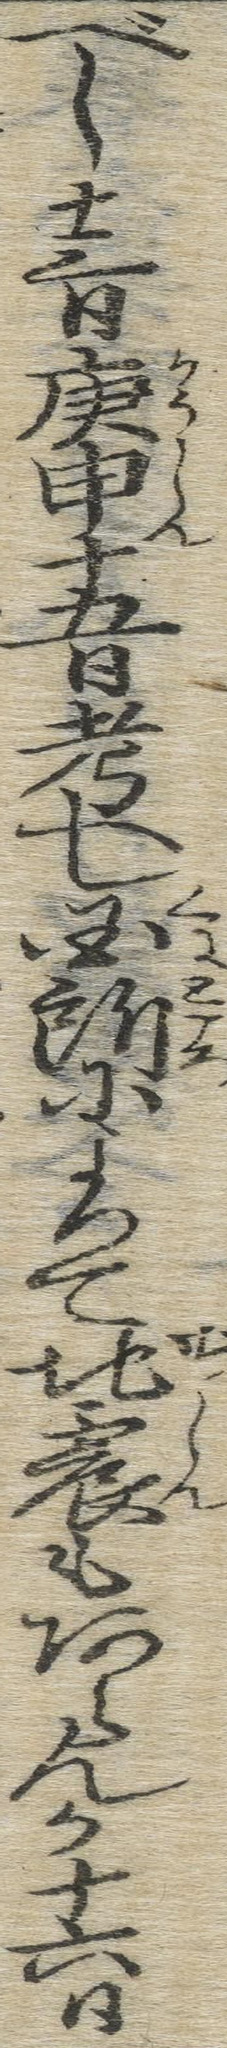べし十三日庚申十五日考へし国所によりて地震もあらんか十六日
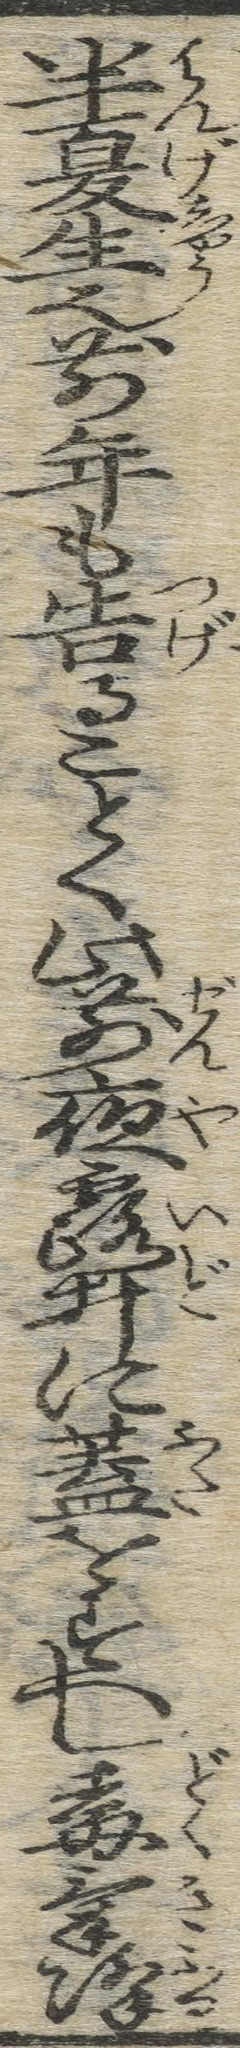半夏生也前年も告ることく此前夜露井に蓋をすへし毒気降
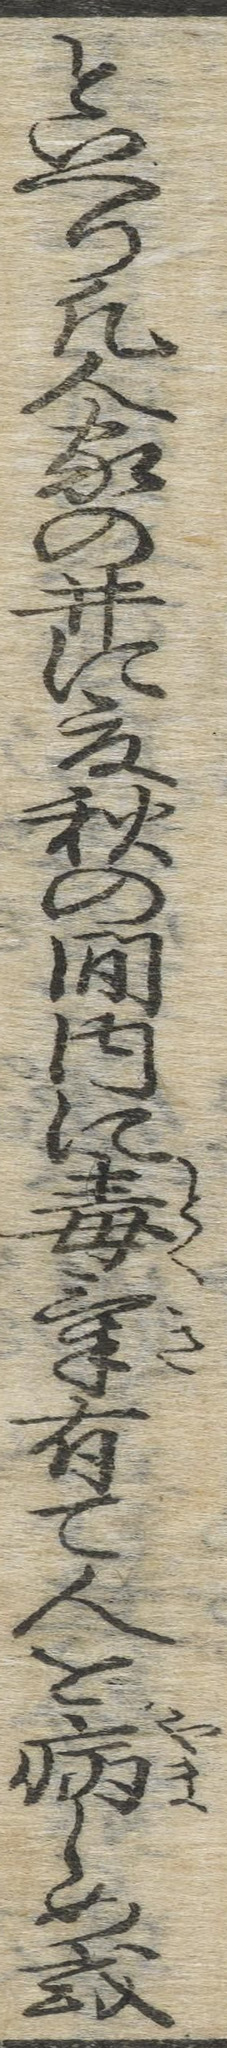といへり凡人家の井に立秋の間内に毒気有て人を病しめ或
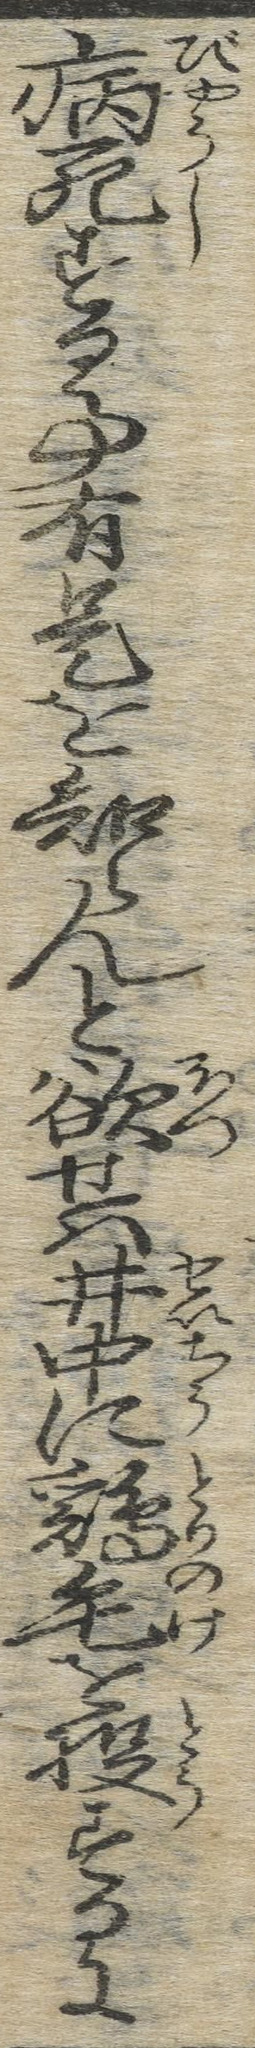病死する事有是を知らんと欲せは井中に鶏毛を投するに
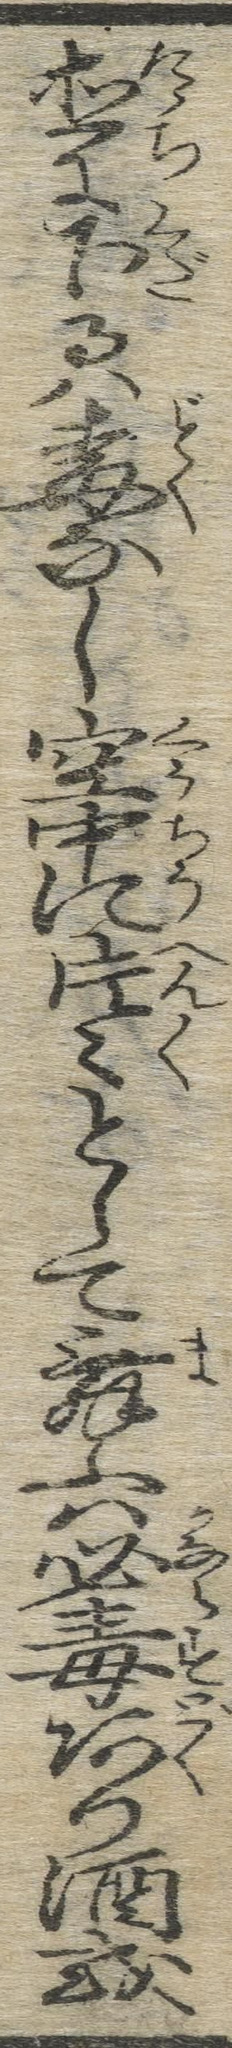直に下るは毒なし空中に片〻として舞ふは必毒あり酒或
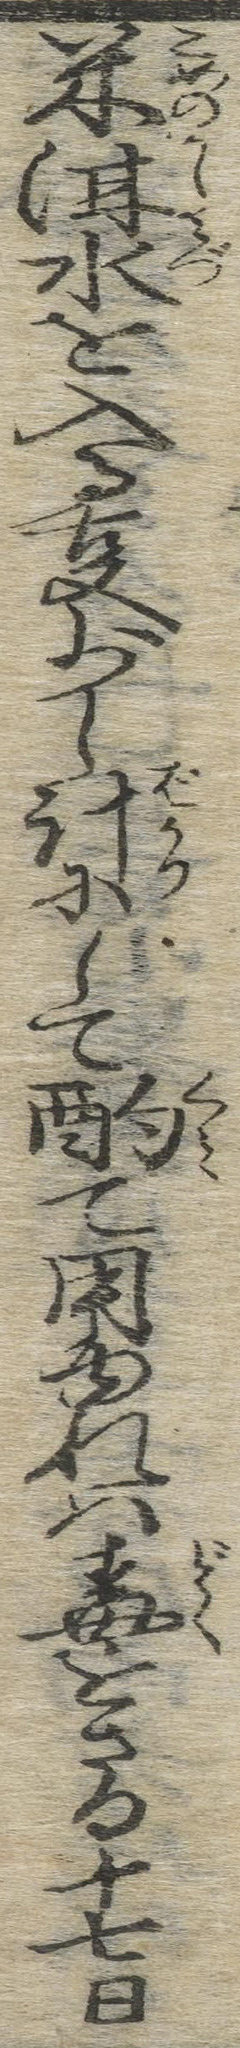米洱水を入る事少し計にして酌て用ゆれは毒をさる十七日

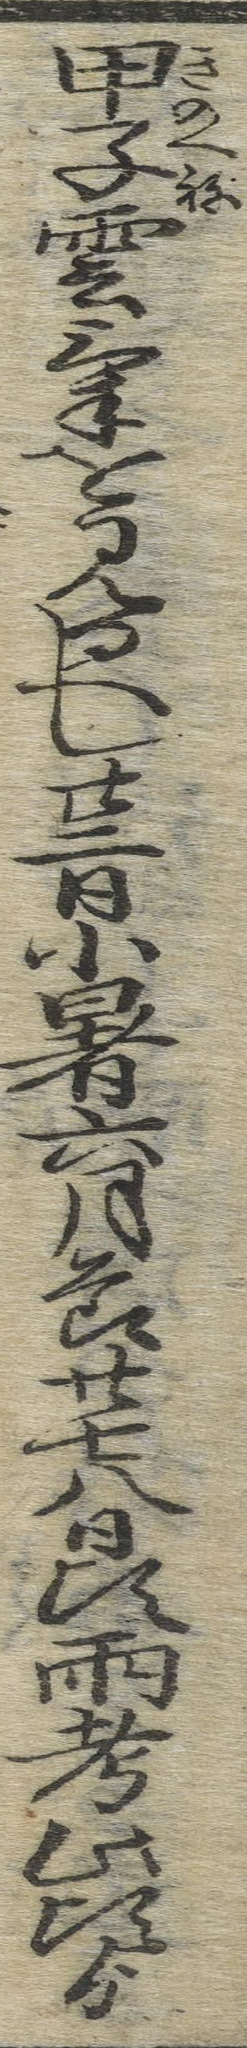甲子雲気を見るへし廿二日小暑六月節廿七八日頃雨考此頃ゟ
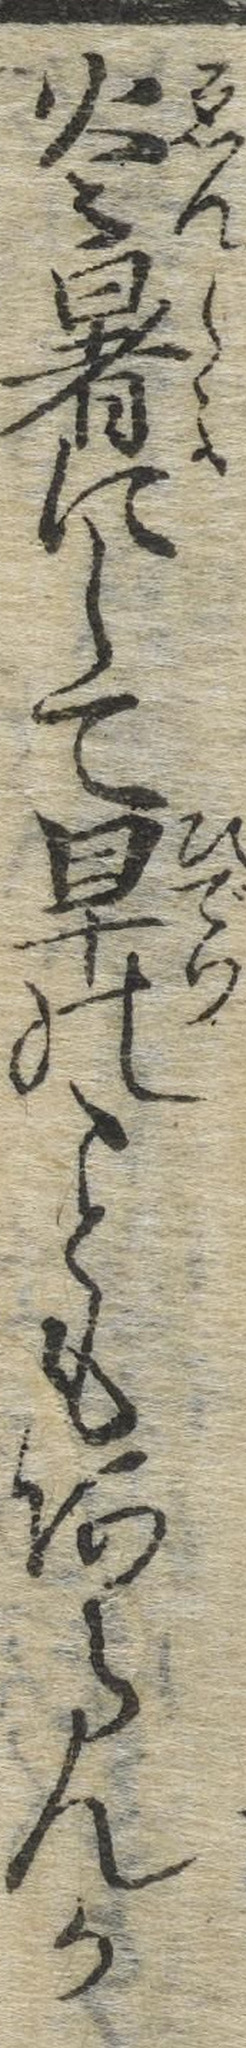炎暑にして旱のこともあらんか
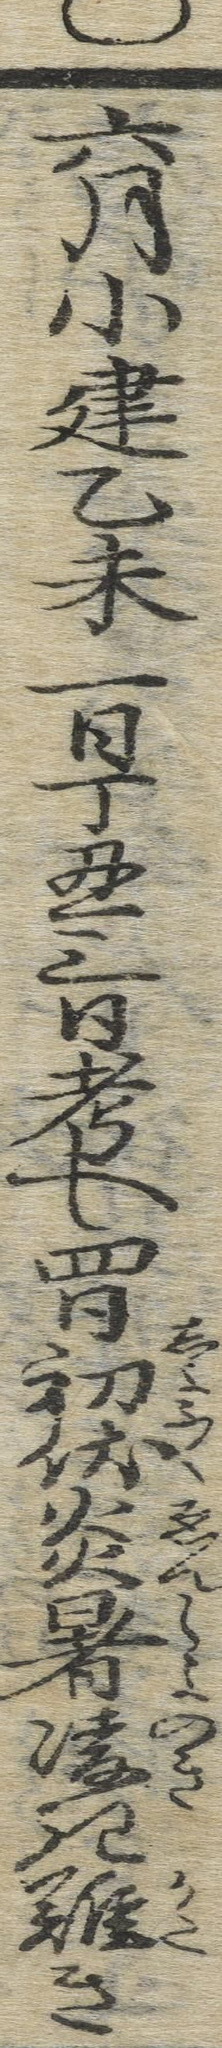六月小建乙未一日丁丑三日考へし四日初伏炎暑凌き難き
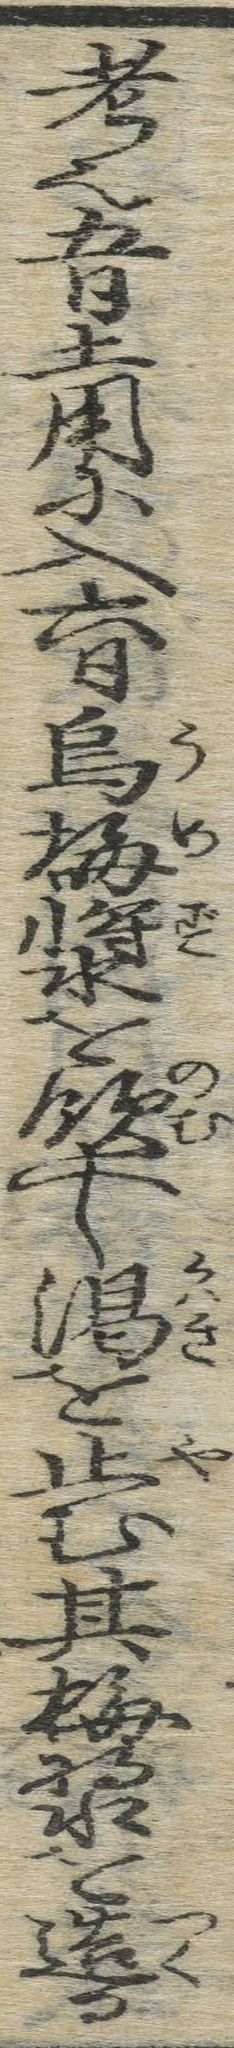考也五日土用に入六日烏梅漿を飲へし渇を止む其梅漿を造る
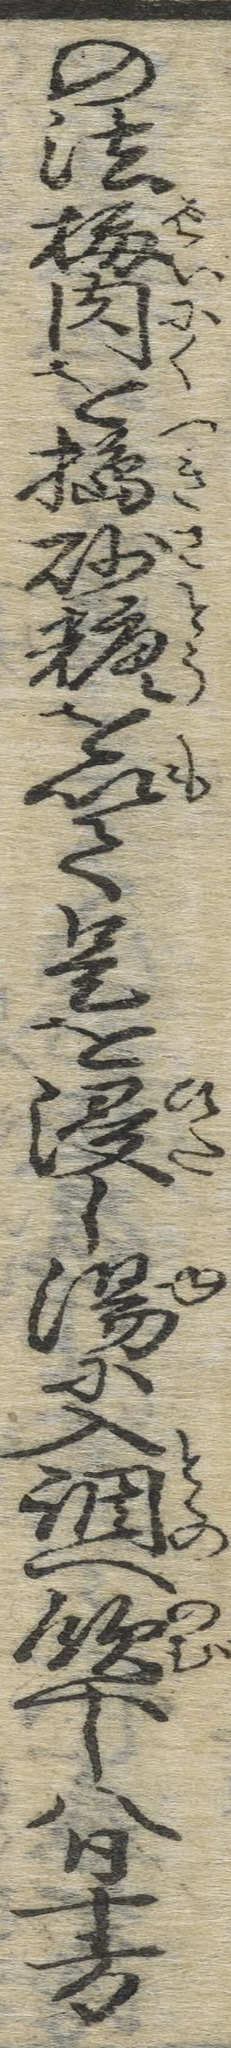の法梅肉を搗砂糖を以て是を浸し湯に入調へ飲へし八日十方
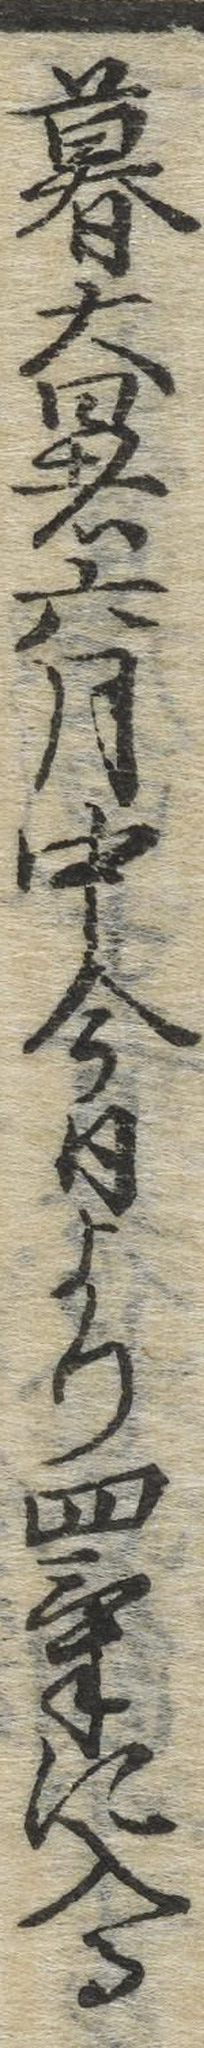暮大暑六月中今日より四気に入る
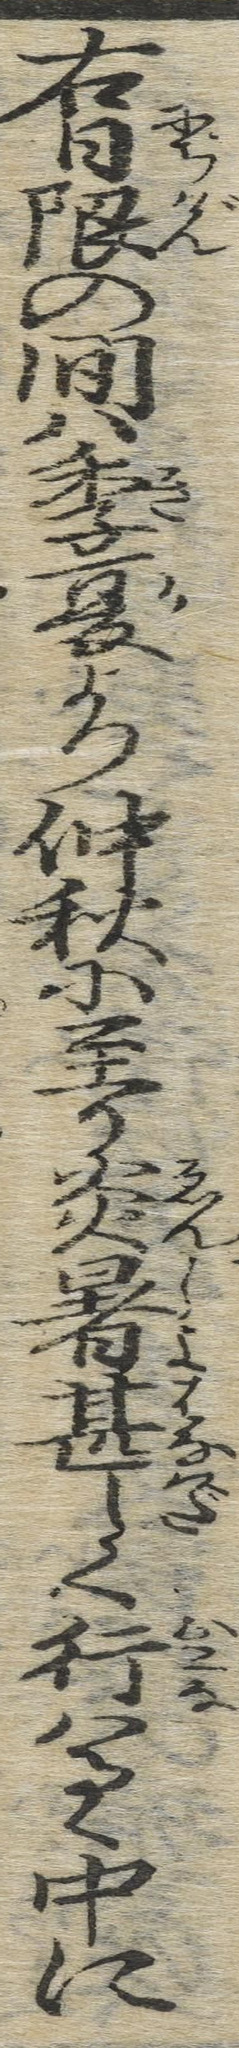右日限の間は季夏より仲秋に至り炎暑甚しく行はるゝ中に
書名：[晴雨考]
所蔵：東京大学地震研究所図書室 Earthquake Research Institute Library, The University of Tokyo, JAPAN
